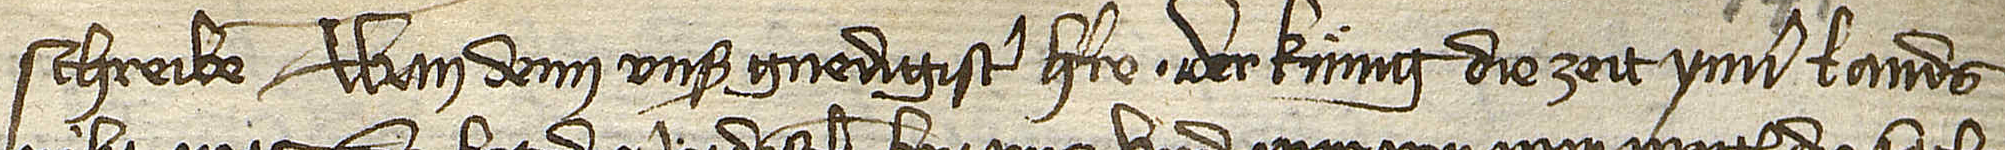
ſchreibe* / Wan denn vnſ* gnedigiſt* h*re . der künig die ʒeit ynn* lands
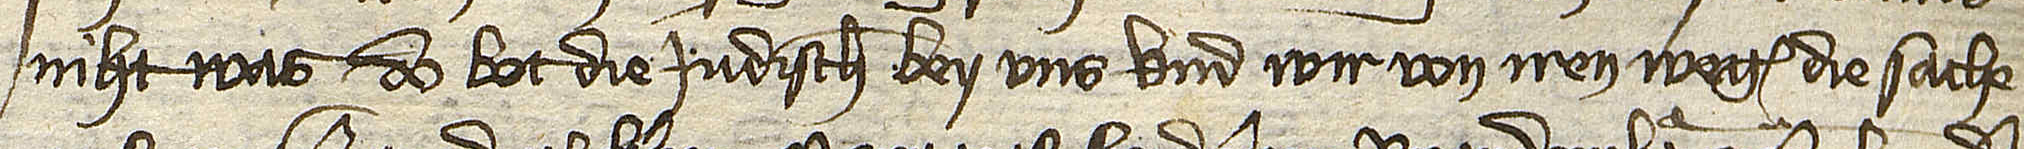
niht was / do bot die Iudiſch* bey vns Vnd wir von iren weg* die ſache
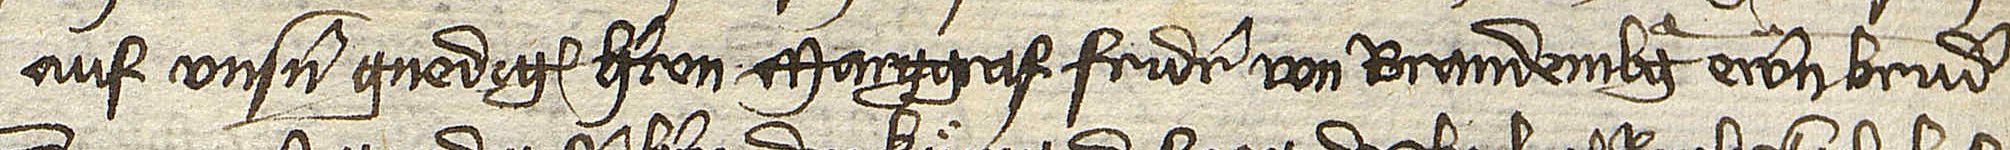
auf vnſn* gnedig* h*ren Marggraf fridr* von Brandenb*g eẅ*n brud*
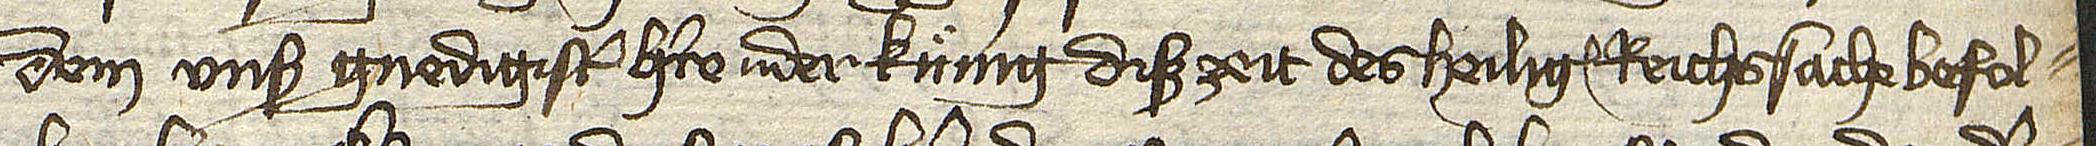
denn vnſ* gnedigiſt* h*re ~ der künig diſʒ ʒeit des heilig* Reichs ſache befol =
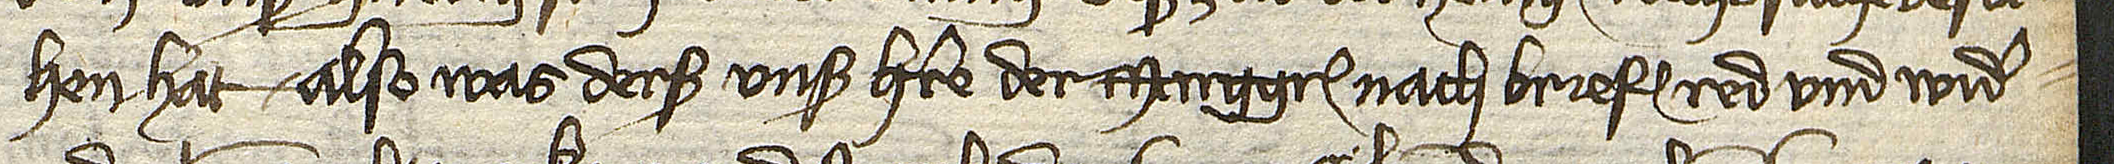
hen hat / alſo was derſ* vnſ* h*re der Marggr* nach brief* red vnd wid* =
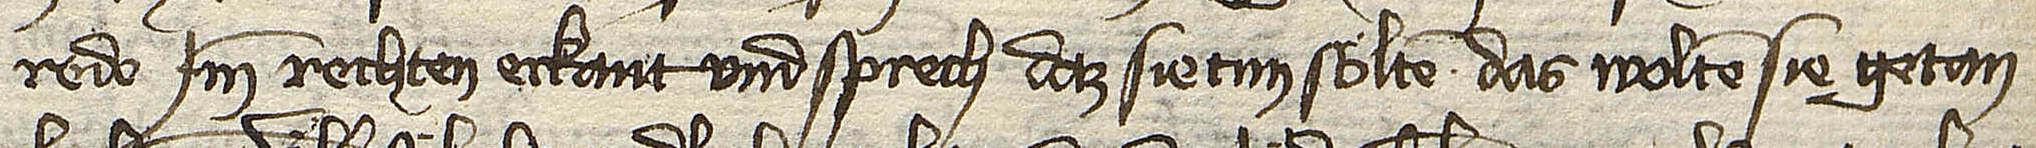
rede Im* rechten erkant vnd ſprech daʒ ſie tun ſölte* das wolte* ſie getan
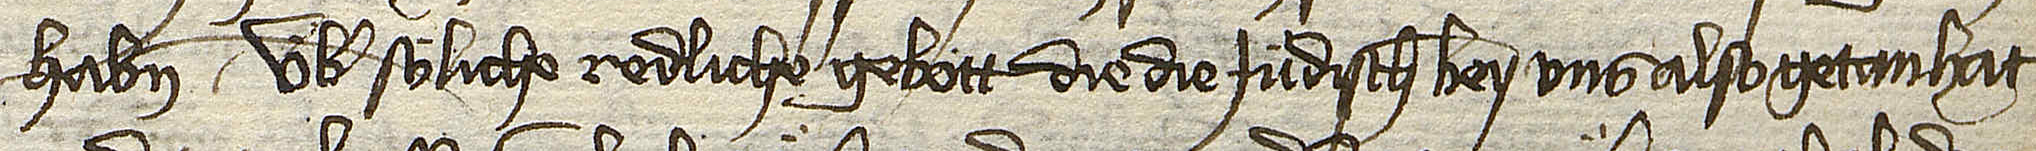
habn* / V̈b* ſöliche redliche gebott die die Iüdiſch* bey vns alſo getan hat
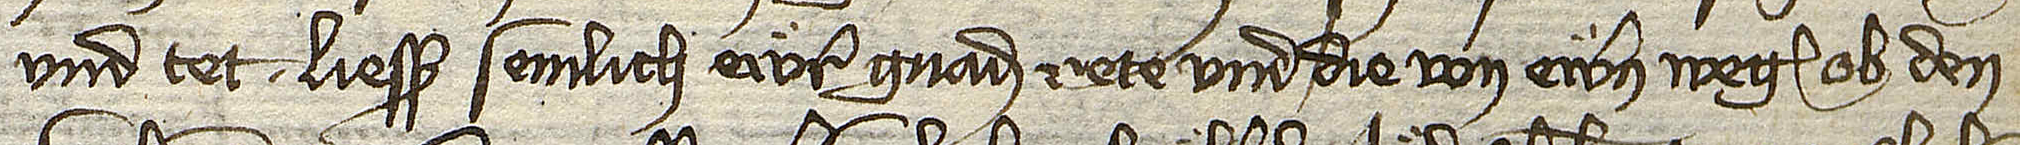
vnd tet / lieſſ* ſemlich eẅr* gnad* rete vnd die von eẅ*n weg* ob den
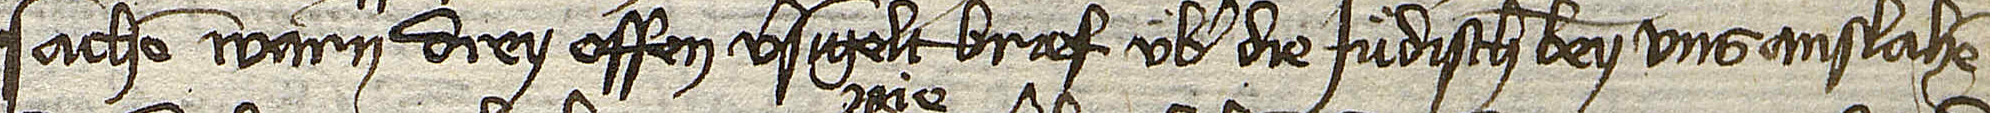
ſache* warn drey offen v*ſigelt brief v̈b* die Iüdiſch* bey vns anſlahe*
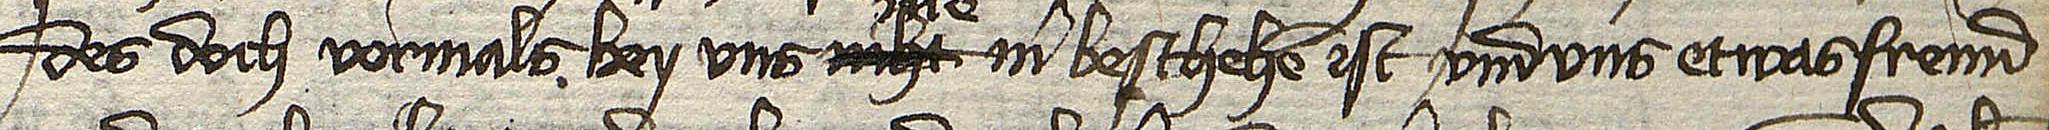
des doch vormals bey vns niht m* beſchehe* iſt vnd vns etwas fremd
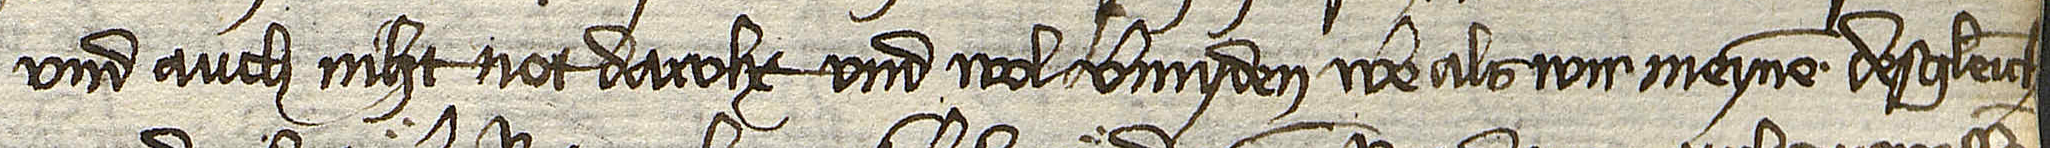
vnd auch niht not dawht vnd wol v*myden w*e als wir meyne* . deſgleich*
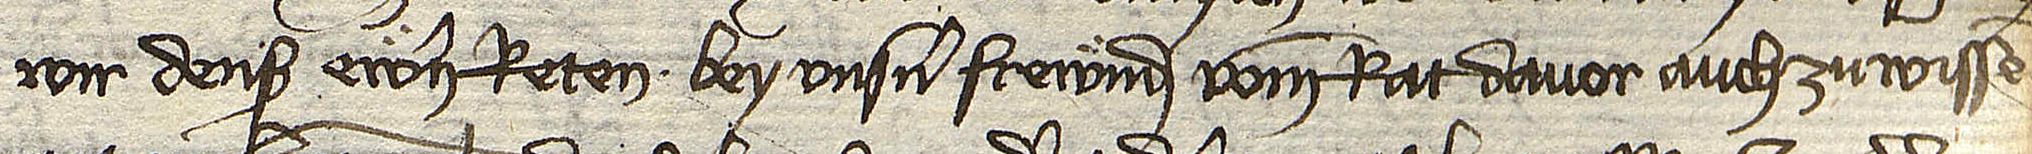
wir denſ* eẅ*n Reten . bey vnſn* freẅnd* vom* Rat dauor auch ʒu wiſſe*
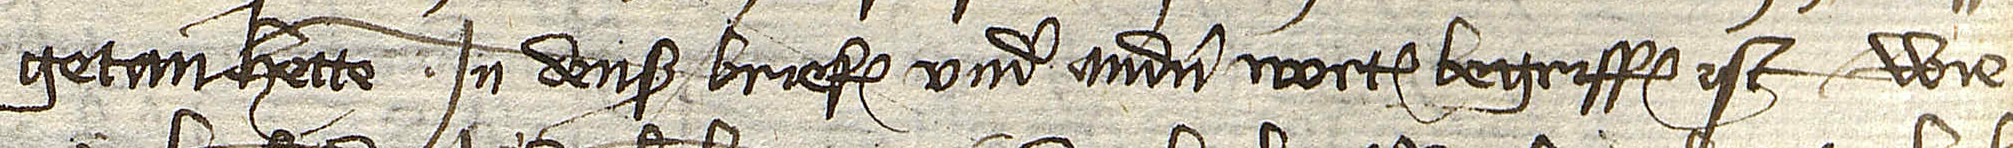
getan hette* . In denſ* brief* vnd* andn* wort* begriff* iſt / wie
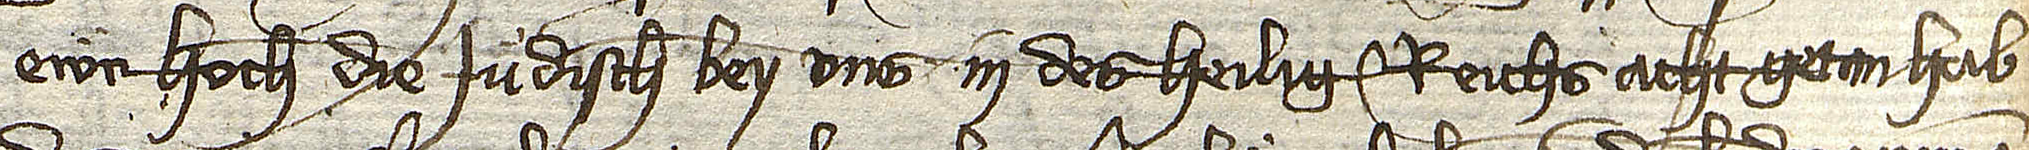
eẅr hoch* die Iüdiſch* bey vns in des heilig* Reichs acht getan hab
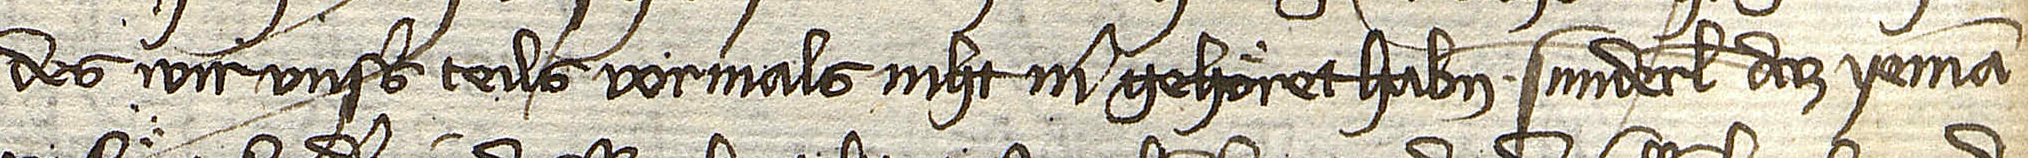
des wir vnſ*s teils vormals niht m* gehöret habn* . ſunderl* daʒ yema*
